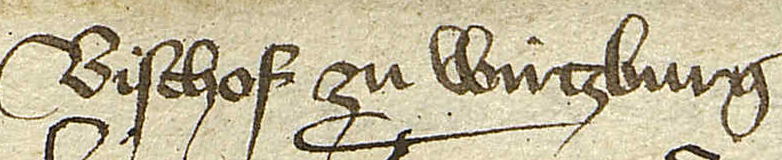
Biſchof cʒu wircʒburg
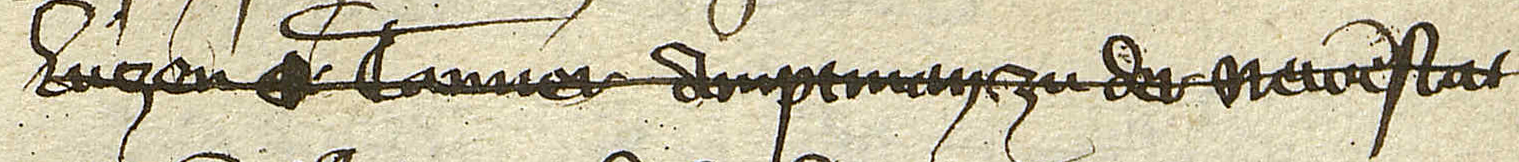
Lücʒen S Tanner Amptman cʒu der Newe*ſtat
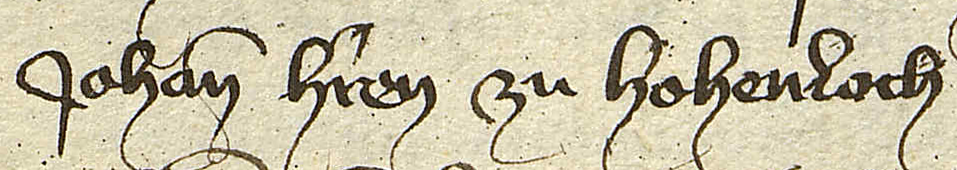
Iohan* hr*en cʒu hohenloch
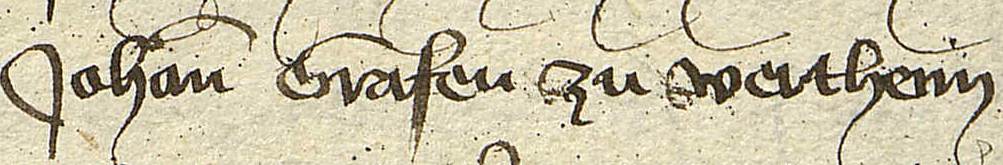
Iohan* Grafen cʒu wertheim
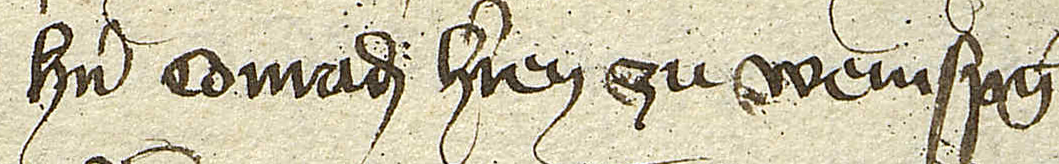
hn* Conrad hr*en cʒu weinſp*g
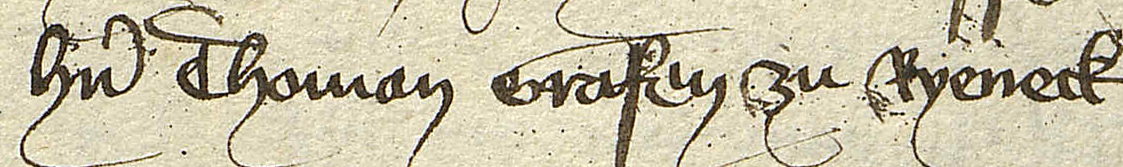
hn* Thoman Grafen cʒu Ryeneck
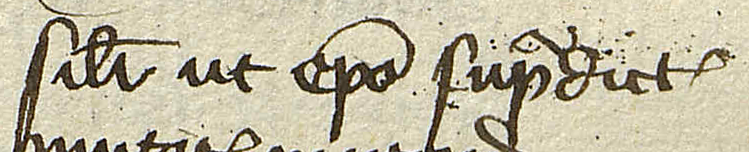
ſilr* ut epo* ſup* dict*
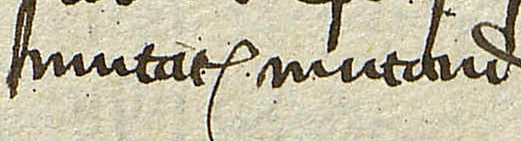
mutat* mutand*
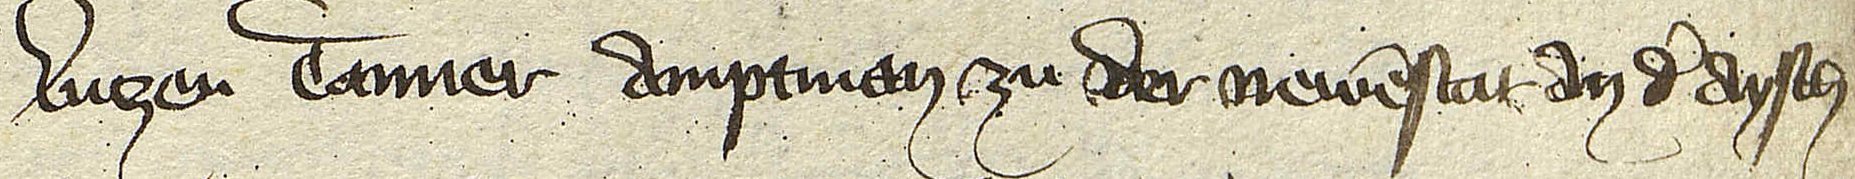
Lucʒen Tanner Amptman cʒu der Newe*ſtat An d* Ayſch
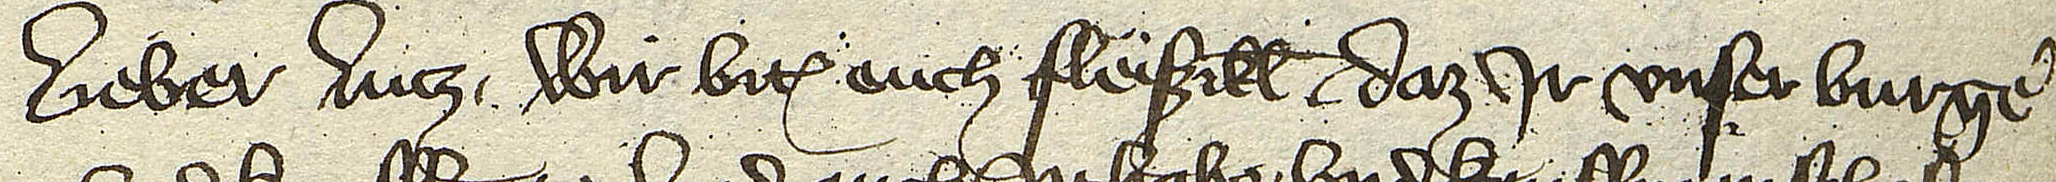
Lieber Lucʒ / Wir bit* euch fleiſʒikl* / daʒ Ir vnſer burge*
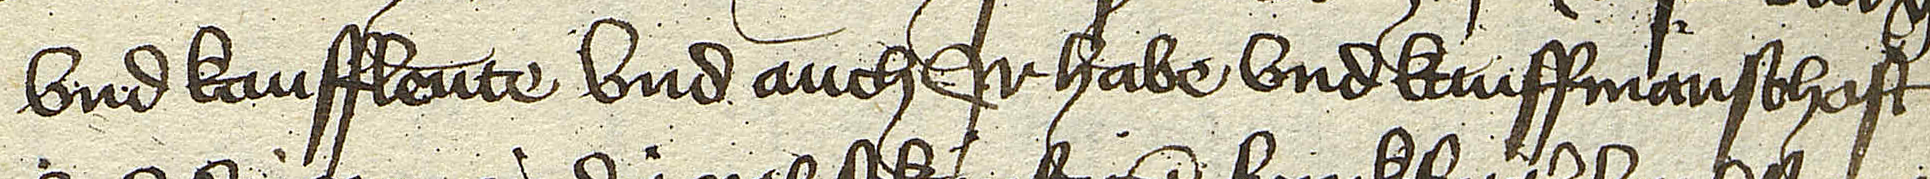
vnd kauffleute vnd auch Ir habe vnd kauffmanſchaft
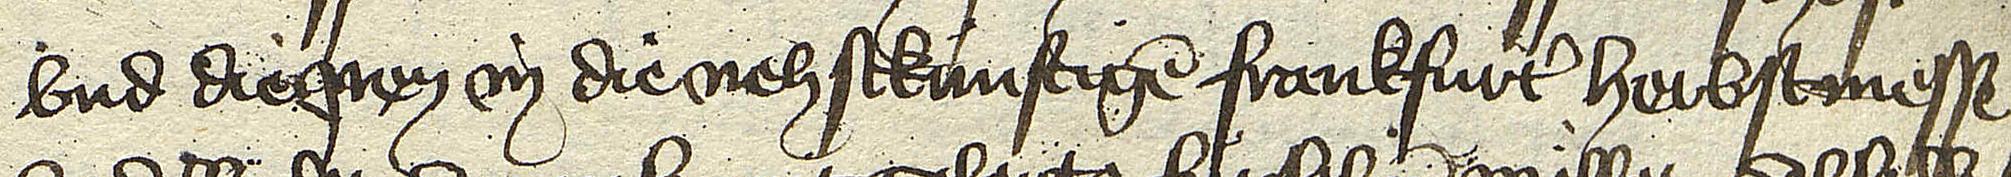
vnd die Iren in die nehſtkünftige* frankfurt* herbſtmeſſe
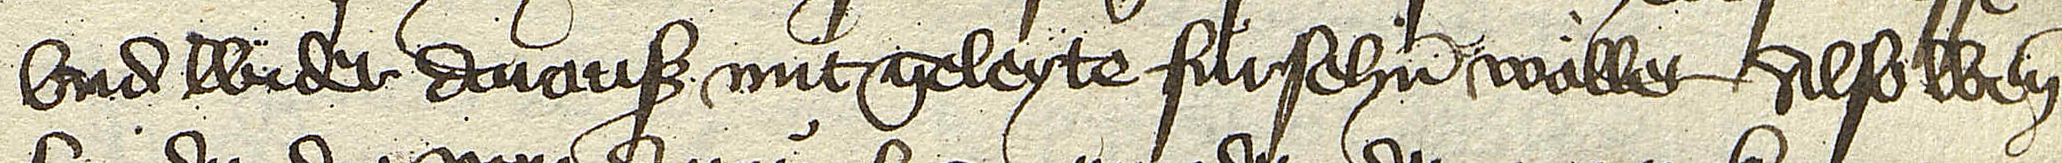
vnd wider darauſʒ mit geleyte fürſehn* wöllet / Alſo wen*
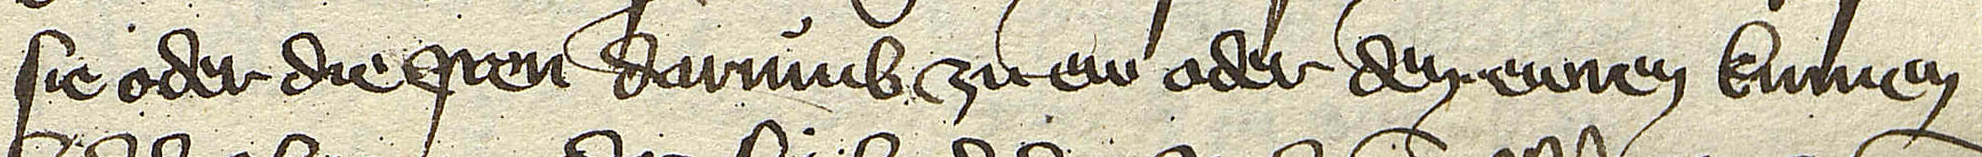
ſie oder die Iren darümb cʒu ew oder den ~ ewren kumen
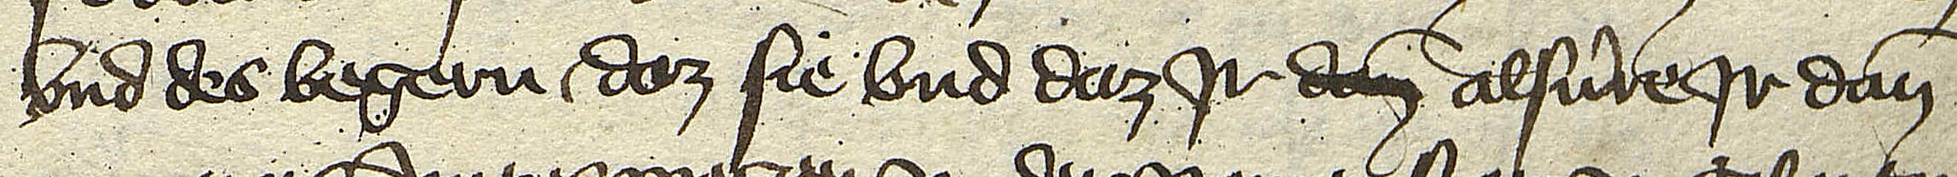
vnd des begern / daʒ ſie vnd daʒ Ir dan* alſu*re Ir dan*
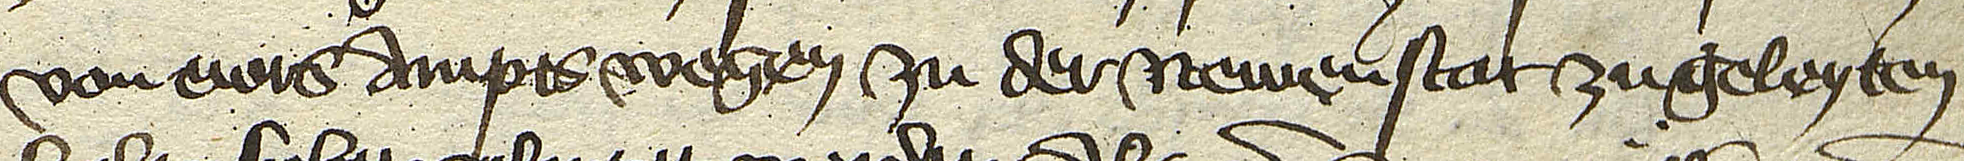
von ewrs Ampts wegen cʒu der Newenſtat cʒu geleyten
